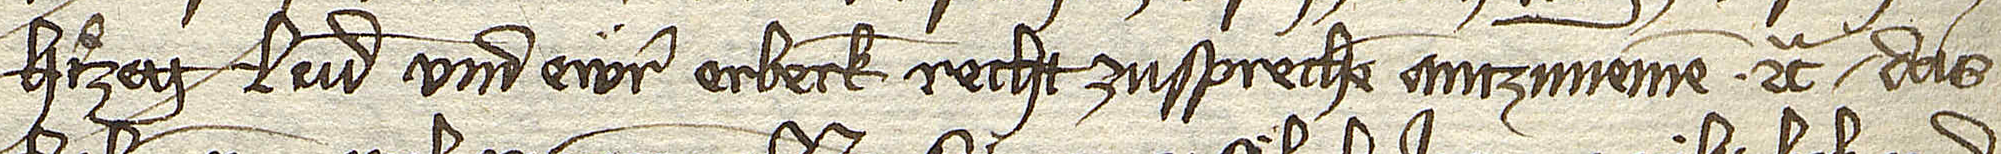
h*cʒog Lud* vnd eẅr* erberk* recht ʒuſpreche* ancʒuneme* . ec* / das
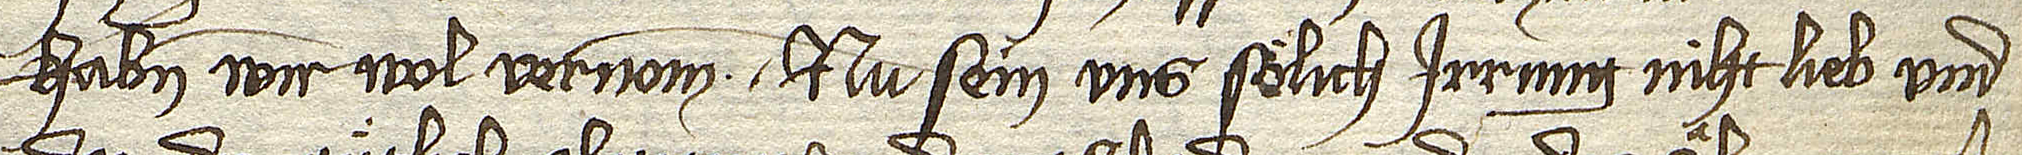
habn* wir wol vernom* . / Nu ſein vns ſölich Irrung niht lieb vnd
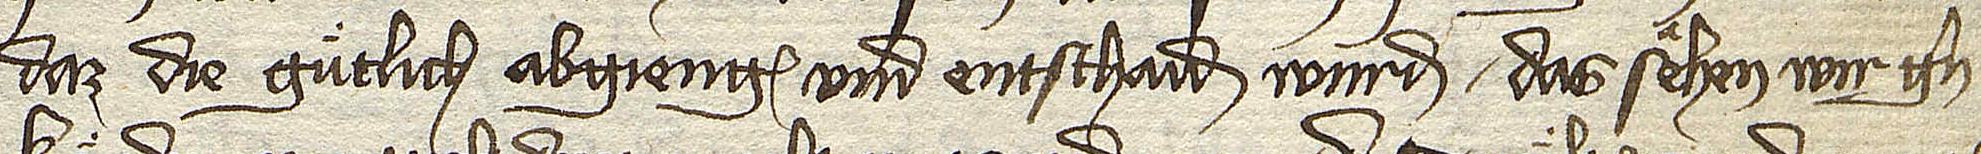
daʒ die gütlich abgieng* vnd entſchaid* wurd* / das ſëhen wir g*n
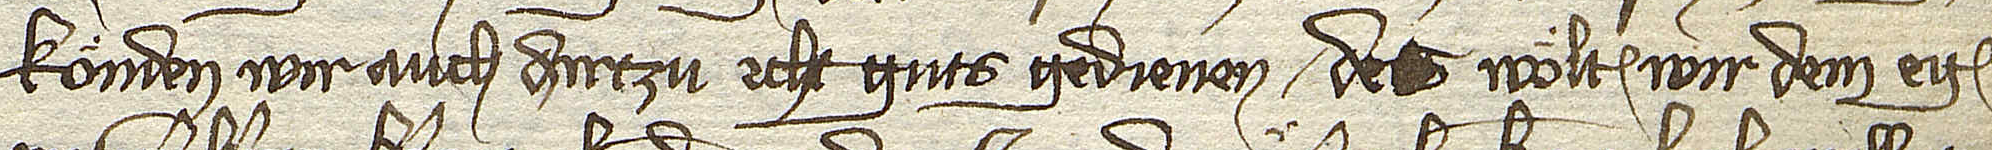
könden wir auch darcʒu icht guts gedienen / Des wölt* wir dem eg*
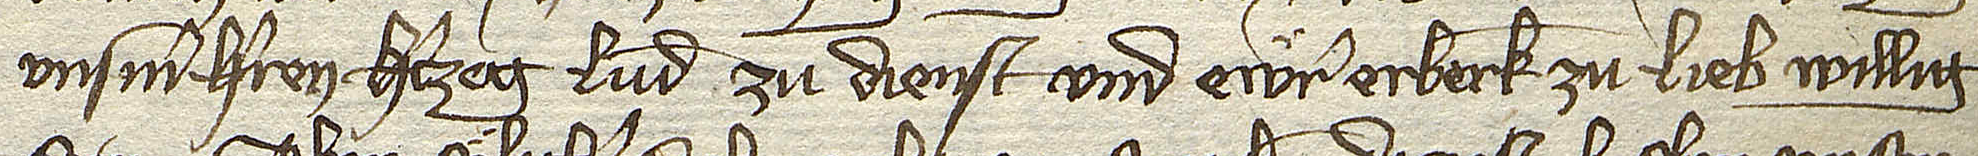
vnſm* h*ren h*cʒog Lud* ʒu dienſt vnd eẅr* erberk* ʒu lieb willig
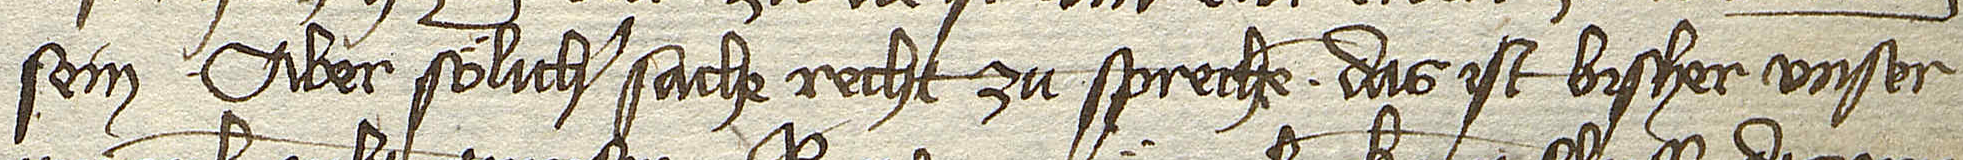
ſein . Aber ſölich* ſache recht ʒu ſpreche* . das iſt biſher vnſer
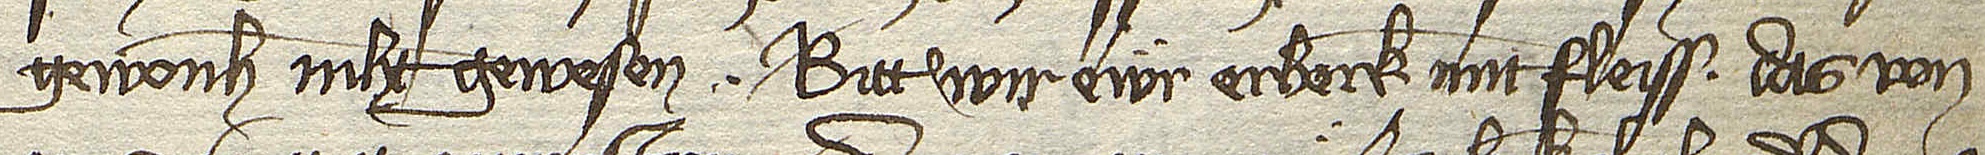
gewonh* niht geweſen . / Bitt* wir eẅr erberk* mit fleiſſ . das von
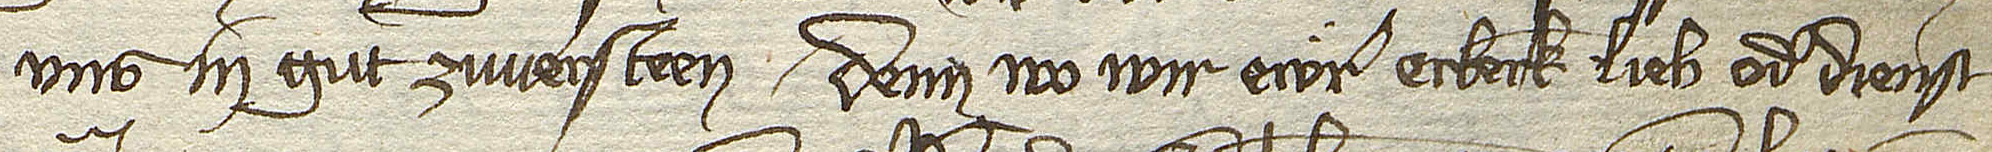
vns in gut ʒuuerſteen / Denn wo wir eẅr* erberk* lieb od* dienſt
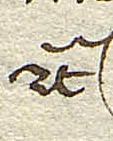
ec*
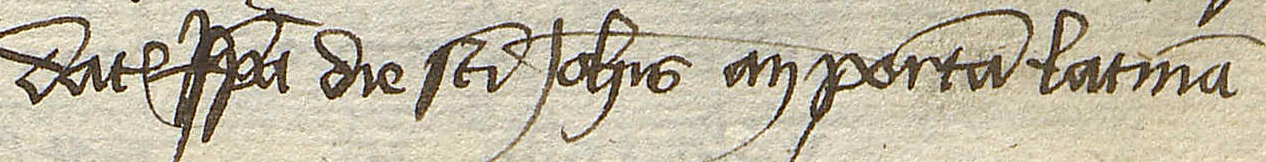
Dat* Ipa* die ſci* Ioh*is an porta* latina*
